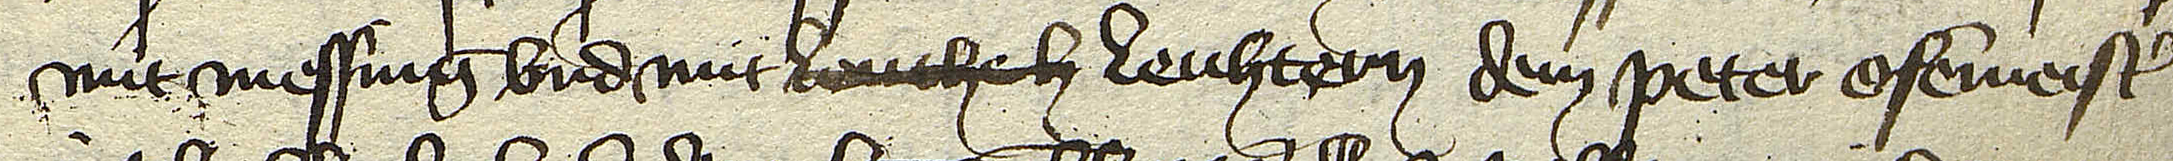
mit meſſing vnd mit leuthe leuhtern dem Peter Ofe*meiſt*
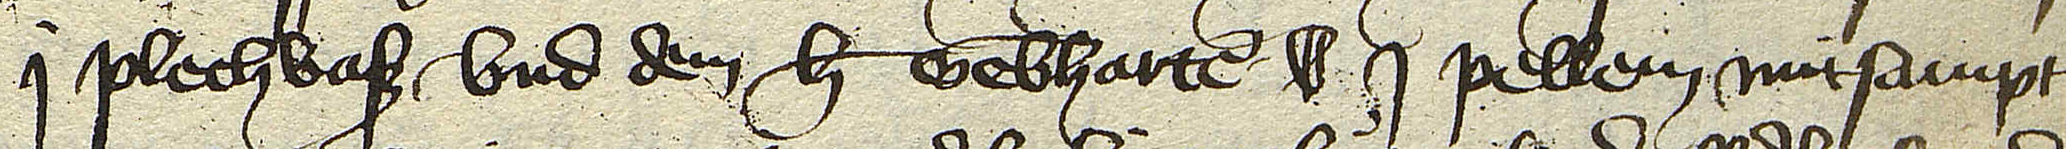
i plechvaſʒ / vnd dem h* Gebharte* v i pellein mitſampt
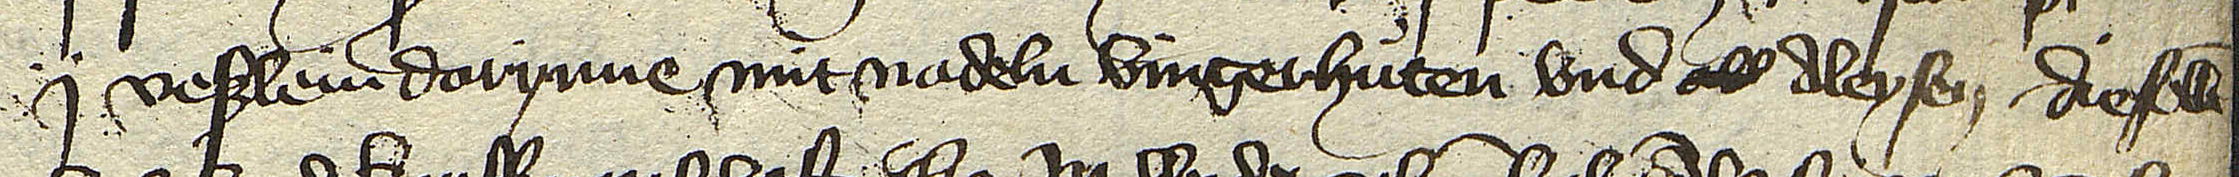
i veſʒlein daryne mit nadeln vingerhüten vnd all Aleyſen / dieſelbe*
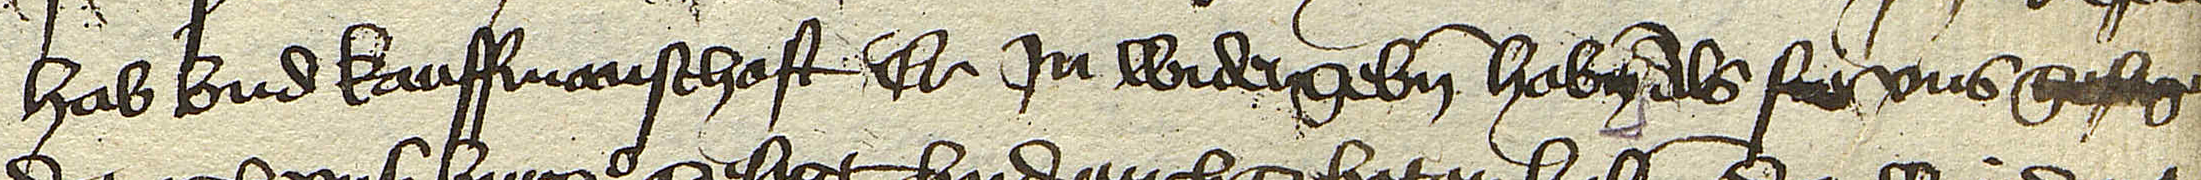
hab vnd kauffmanſchaft Er In widergebn* habn* Als für vns geſagt
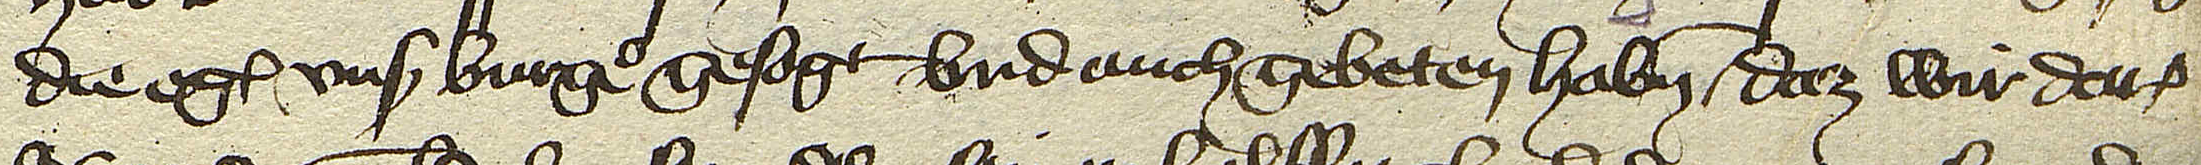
die eg* vnſ* burge* geſagt / vnd auch gebeten habn* / daʒ wir dar*
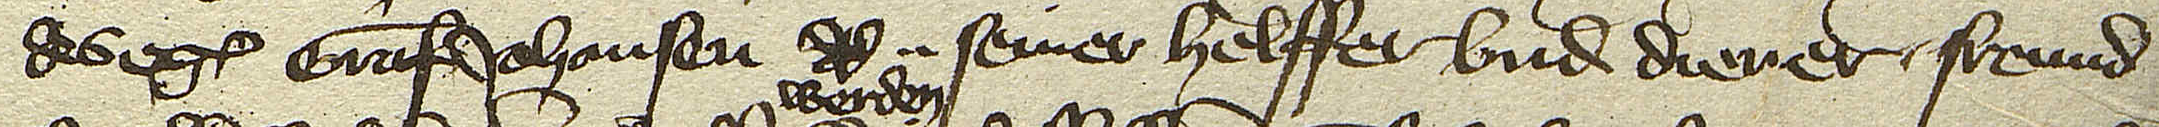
des eg* Graf Iohanſen A ~ ſeiner helffer vnd diener / freund
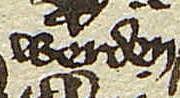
werden
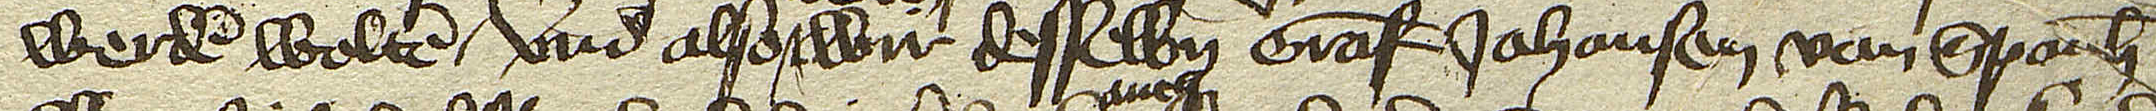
werde* wolte* / vnd alſo wir deſſelbn* Graf Iohanſen vom Spanh*
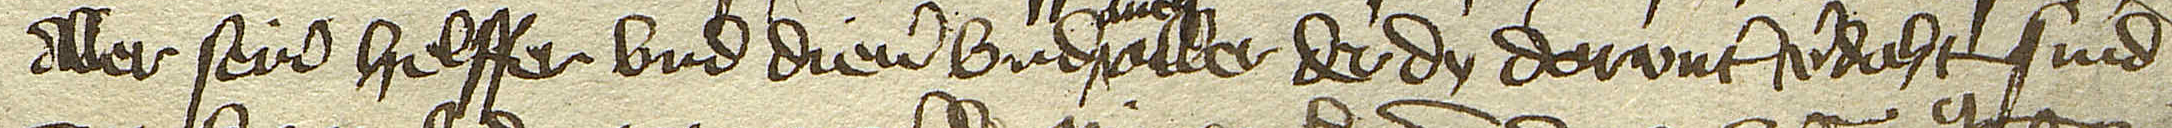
Aller ſein* helffer vnd dien* vnd aller der dy darvnt* v*daht ſind
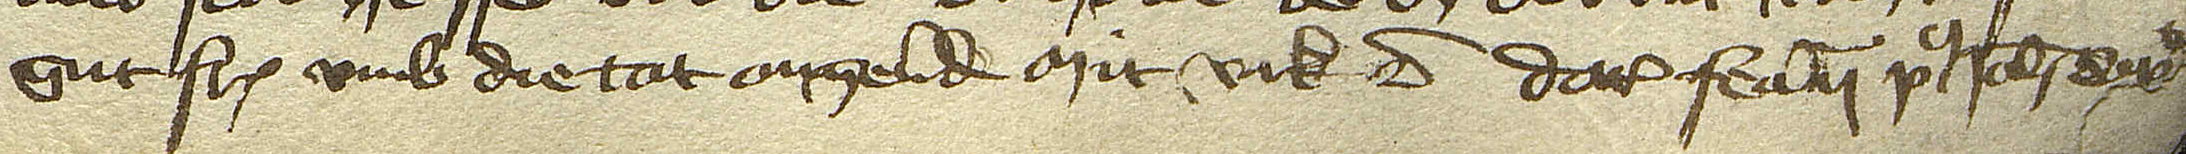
gut fr* vmb die tat ongeu*de Mit vrk* ec* dat* fea* ii* p* Ioh* Bap*
